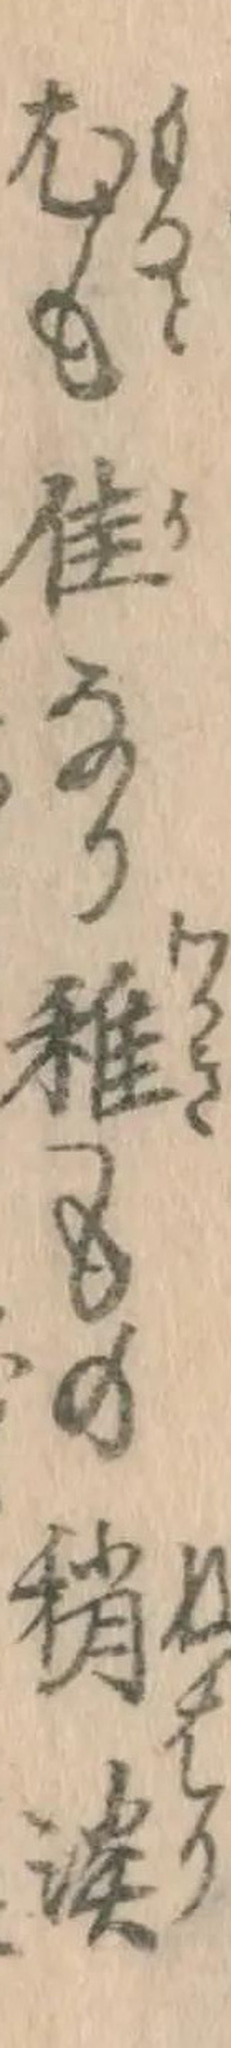尤も佳なり稚もの稍淡
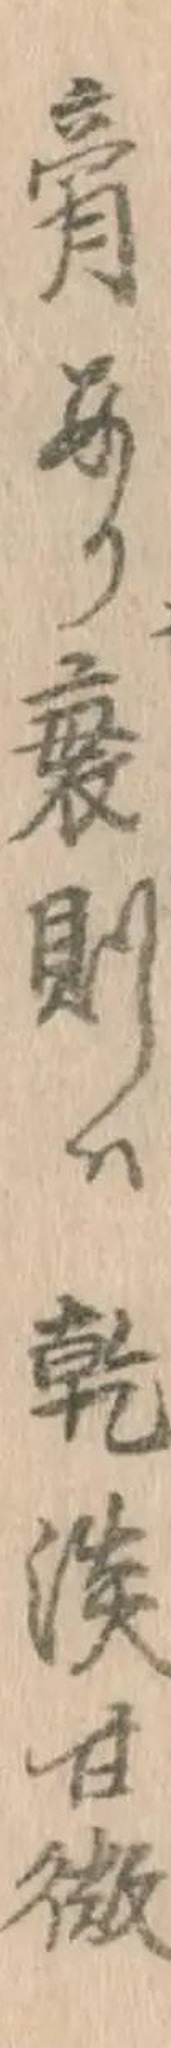膏あり衰則は乾淡甘微
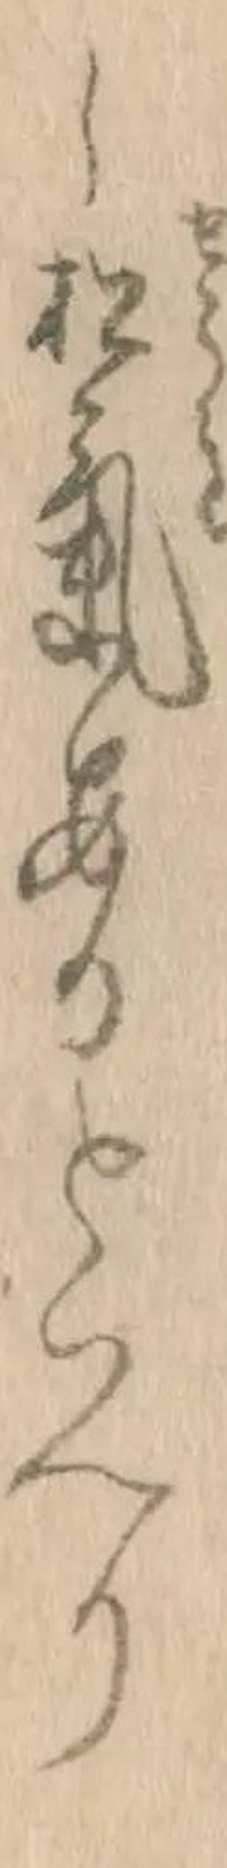し松気ありといへり

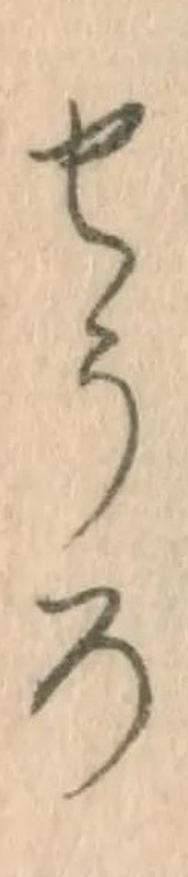せうろ
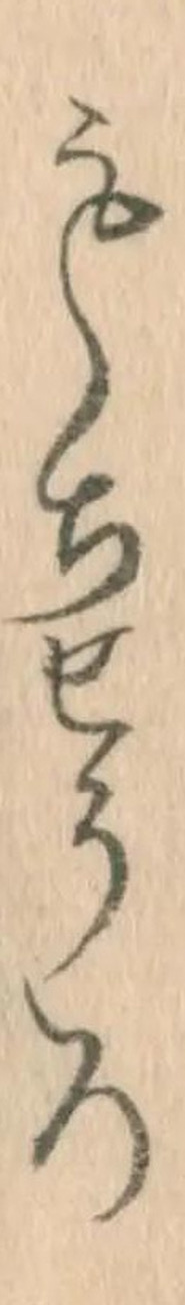もちせうろ
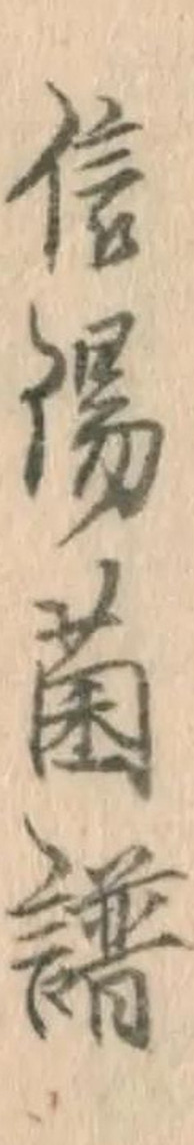信陽菌譜
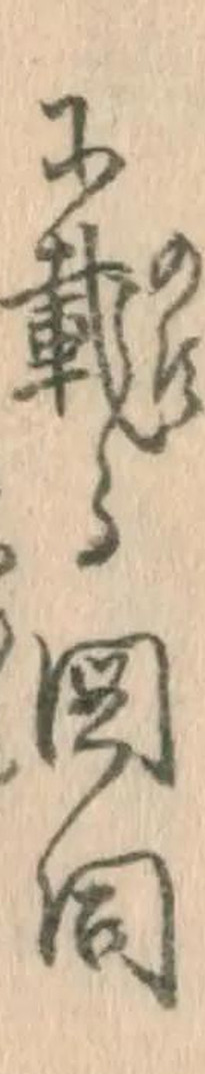に載る図同
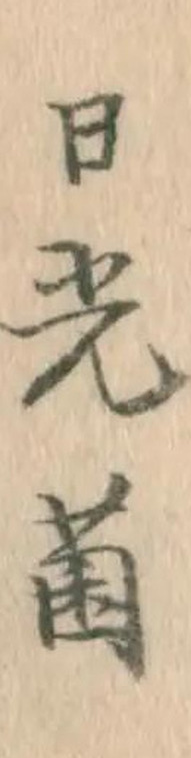日光菌
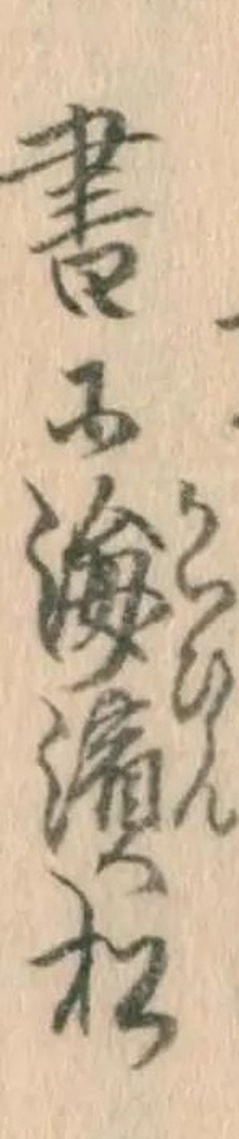書に海浜松
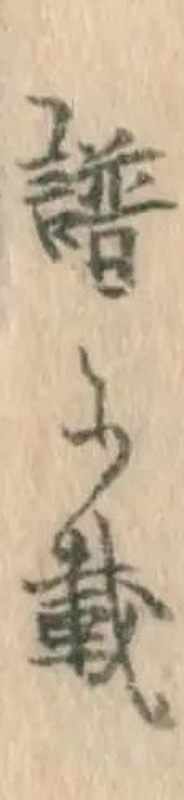譜に載
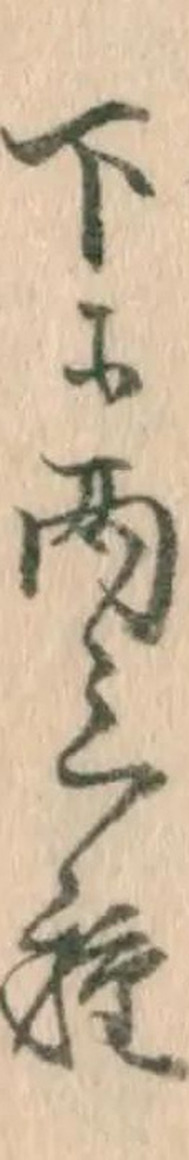下に両三種
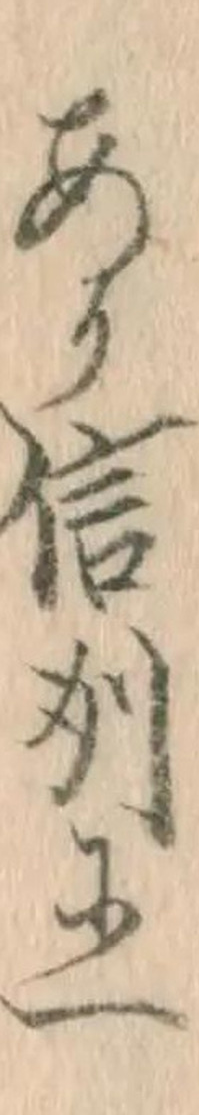あり信州に一
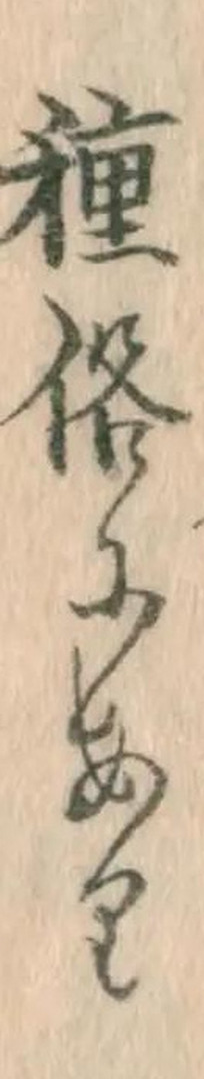種俗にあり
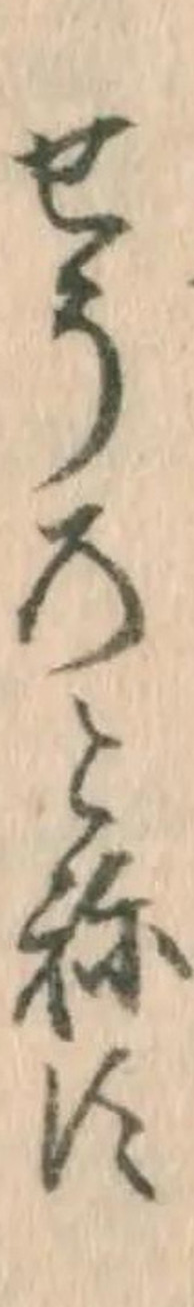せうろと称す
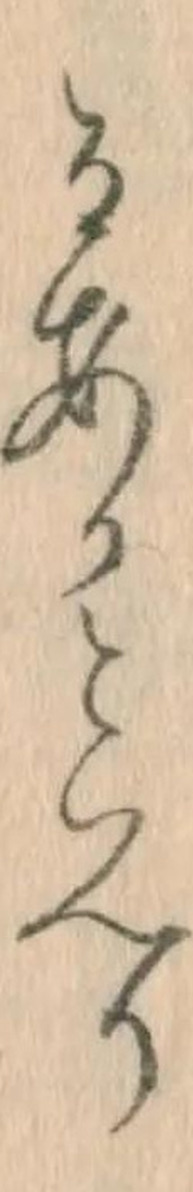るありといへり
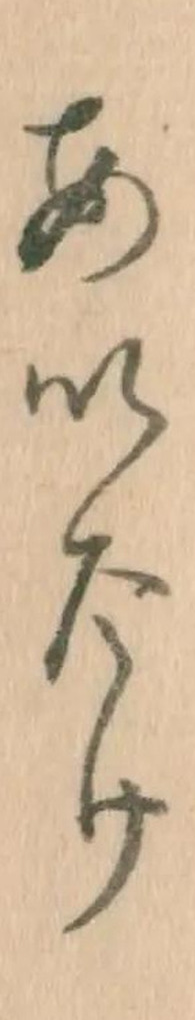あいたけ
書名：本草図譜. 巻55-57
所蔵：国立国会図書館 National Diet Library, JAPAN
